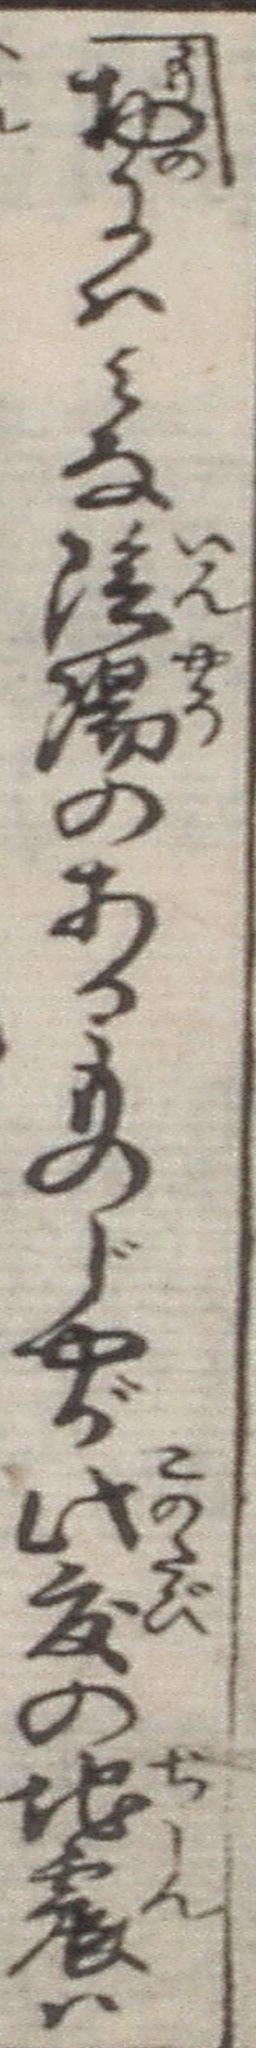〽物にはみな陰陽のあるものじゃが此度の地震は
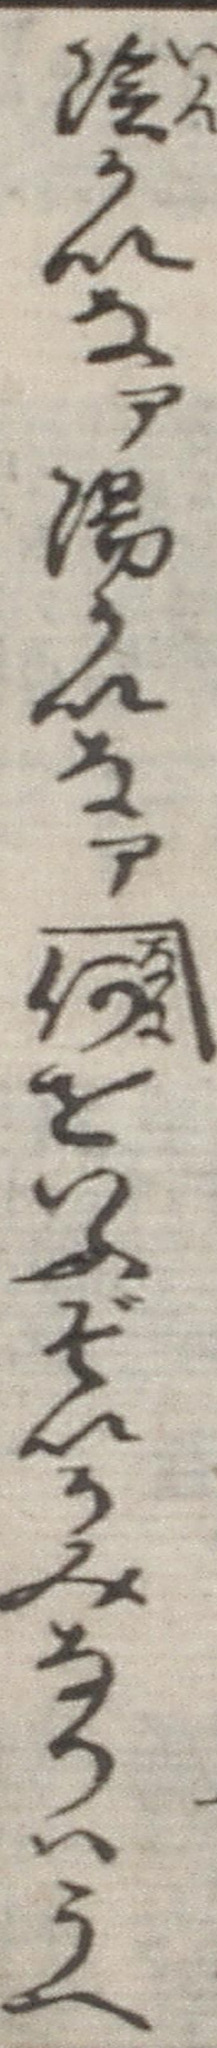陰かいなァ陽かいなァ〽何をいふぞいかみなりはうへ
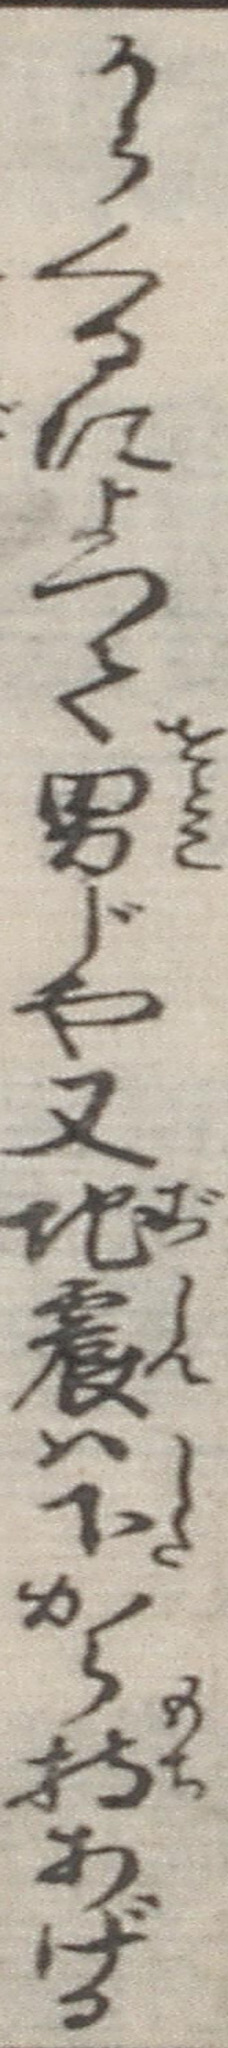からくるによつて男じや又地震は下から持あげる
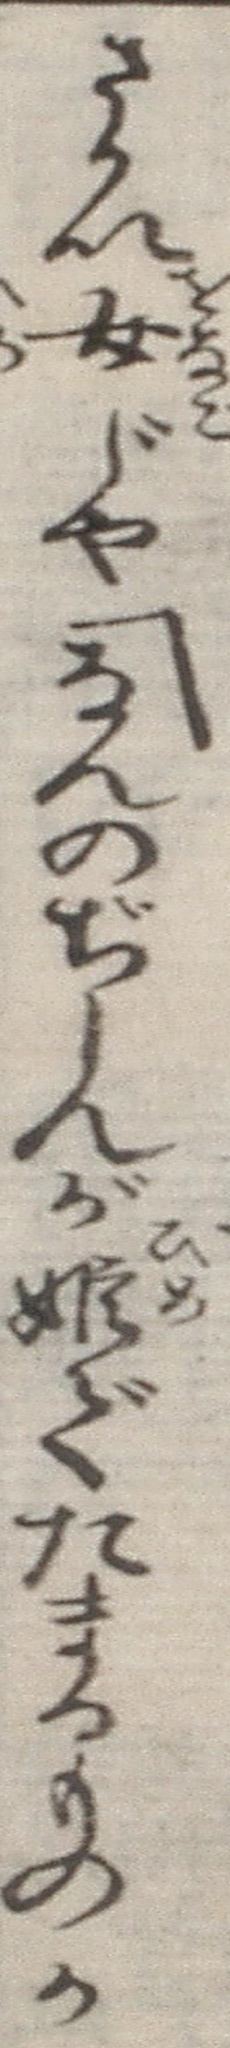さかい女じや〽なんのぢしんが姫でたまるものか
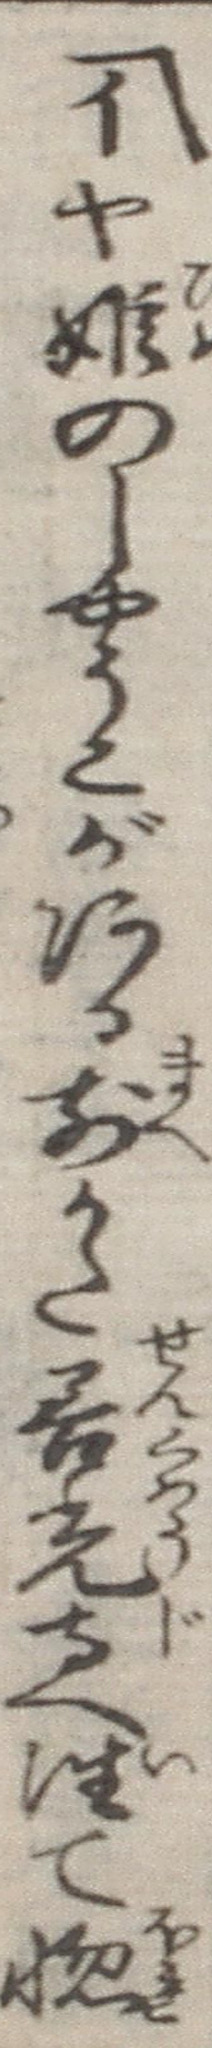〽イヤ姫のしゆうとがある前かた善光寺へ往て惚
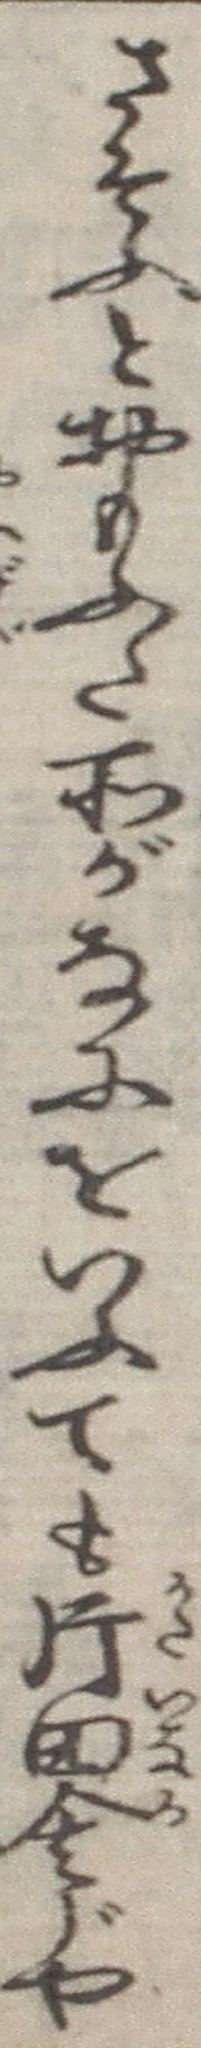さそふとおもふた所がなにをいふても片田舎じや
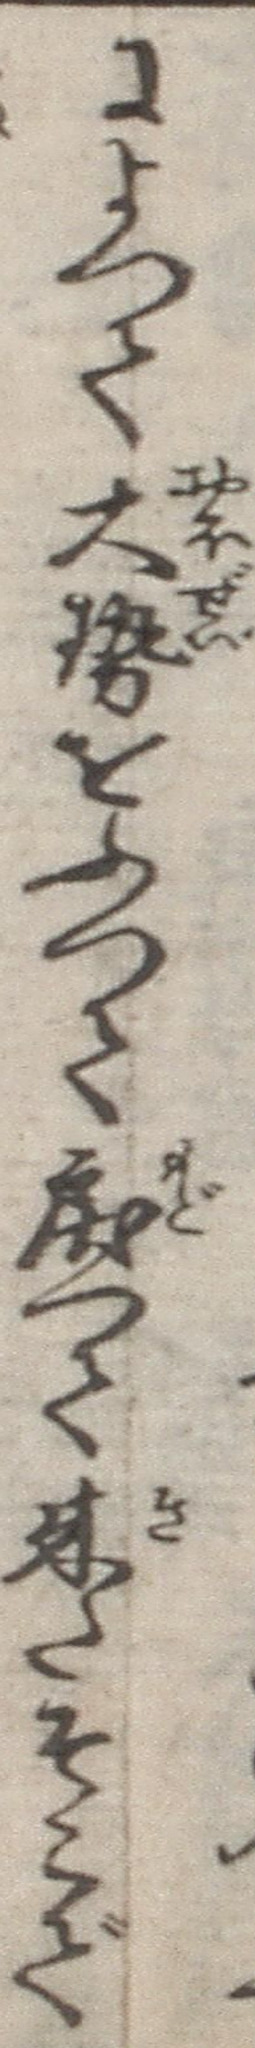によつて大勢をふつて戻つて来たそこで
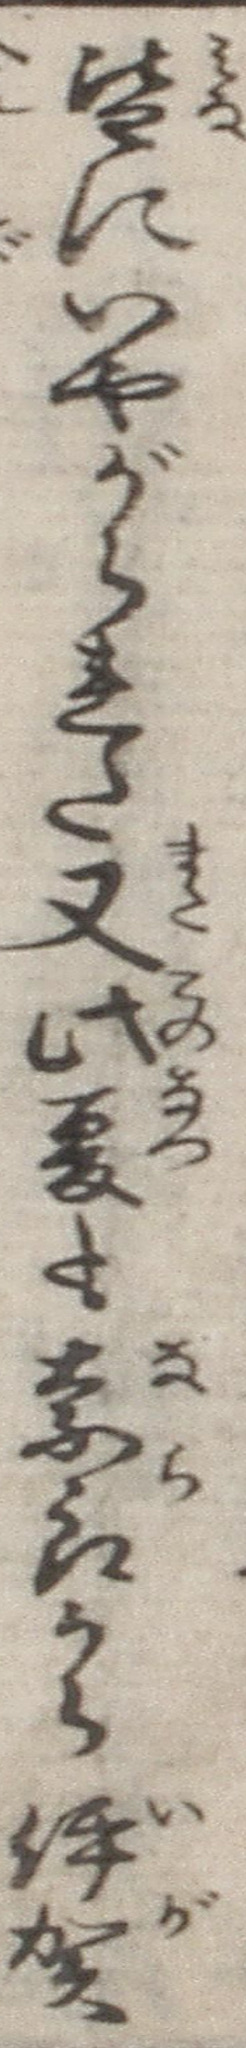皆にいやがられた又此夏も奈良から伊賀
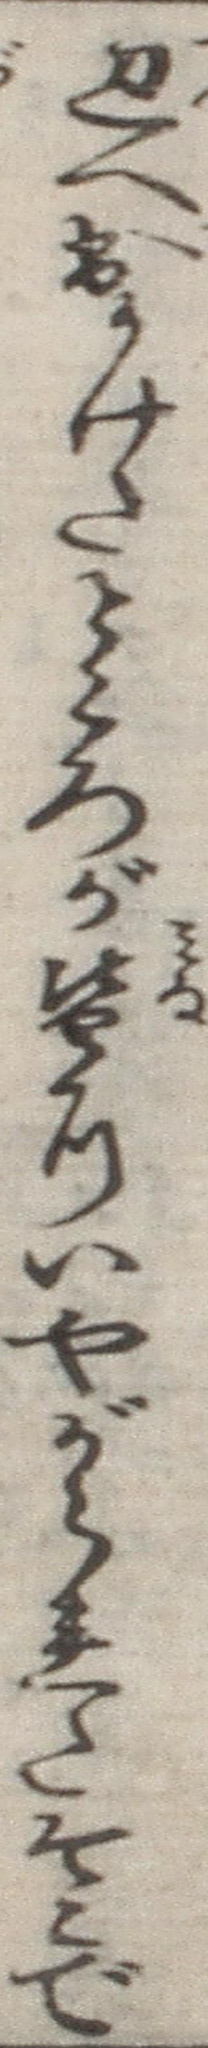辺へ出かけたところが皆にいやがられたそこで
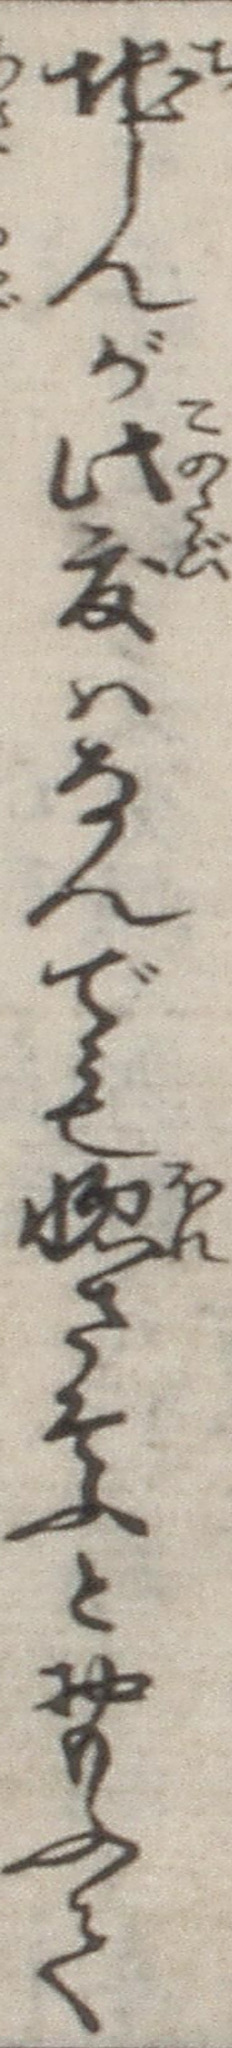地しんが此度はなんでも惚さそふとおもふて
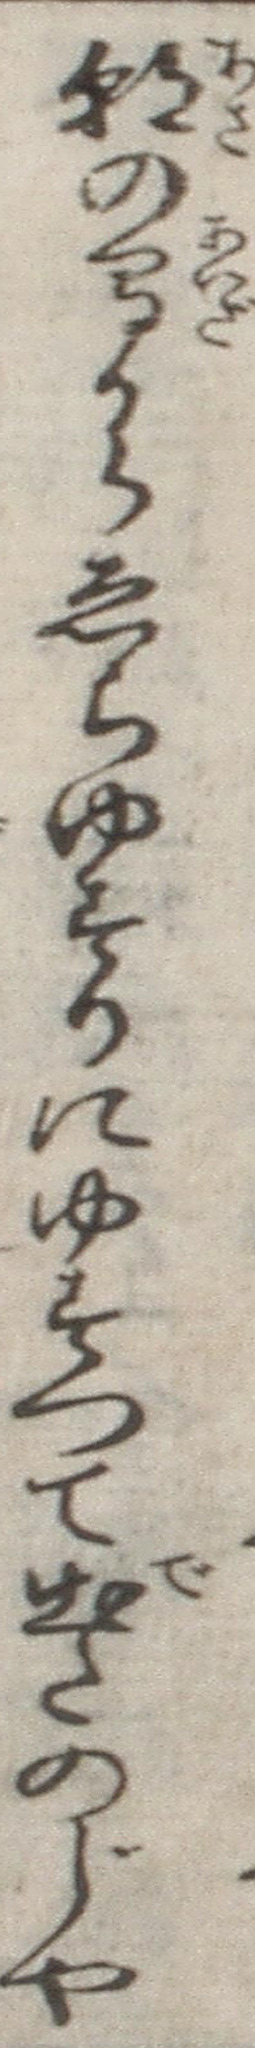朝の間からゑらゆすりにゆすつて出たのじや
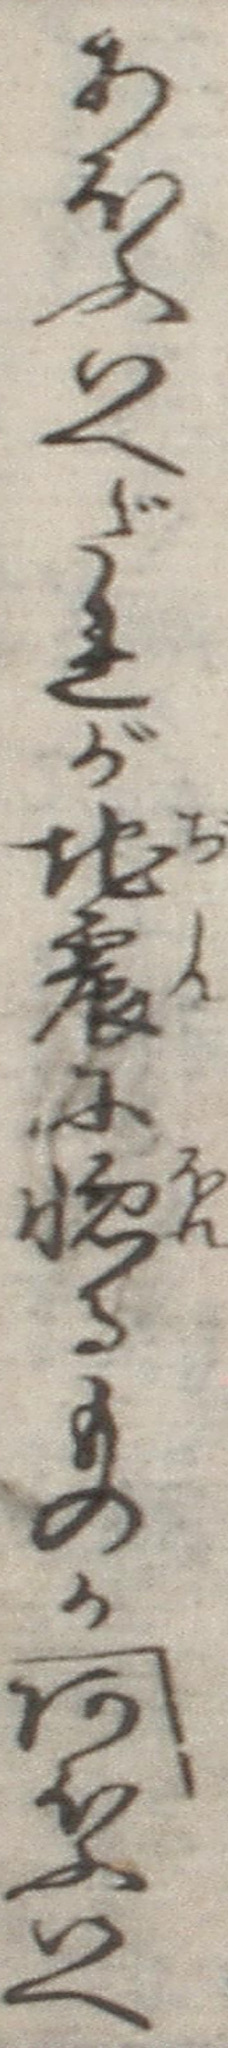あほういへだれが地震に惚るものか〽あほふいへ
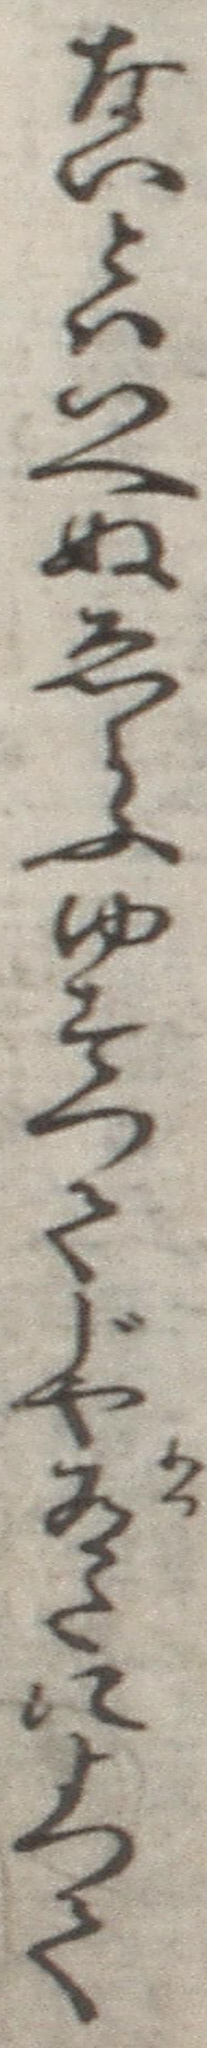ないとはいへぬゑらふゆすつてじや有たによつて
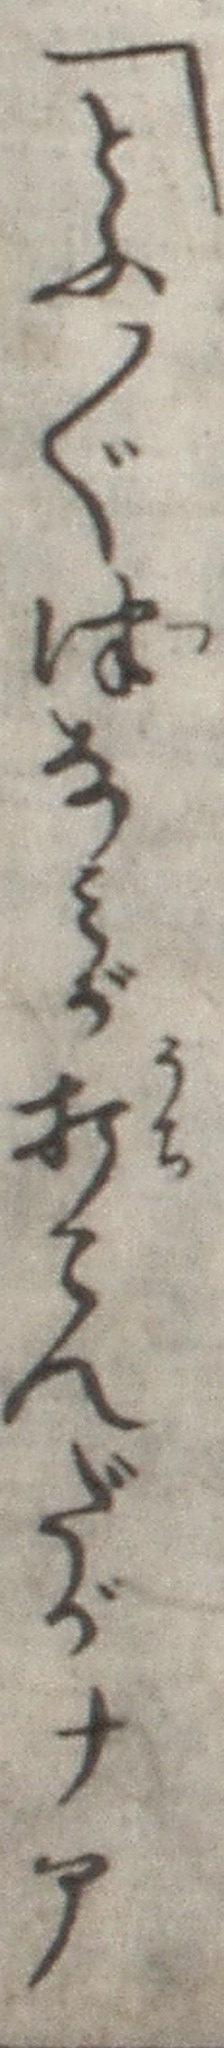落〽とふ〴〵津なみが打こんだがナア

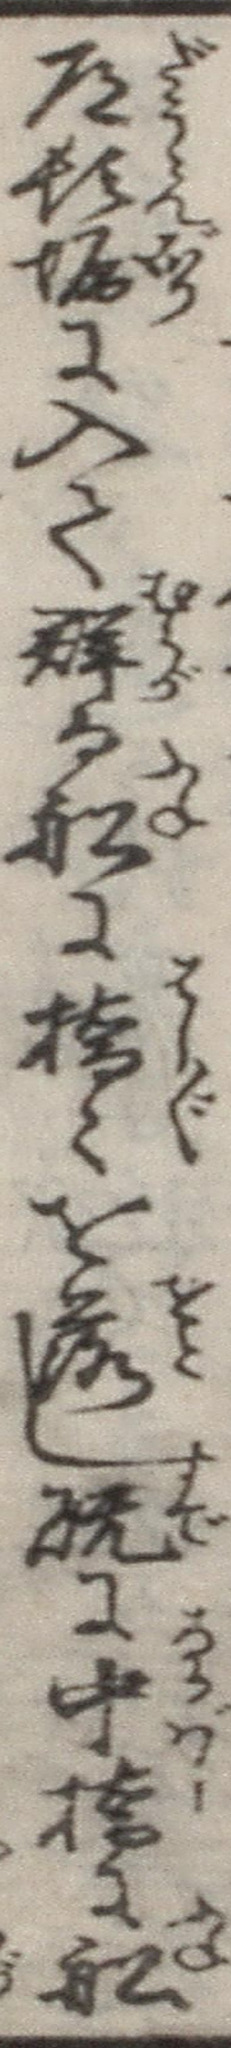道頓堀に入りて群る舩に橋々を落し既に中橋に舩
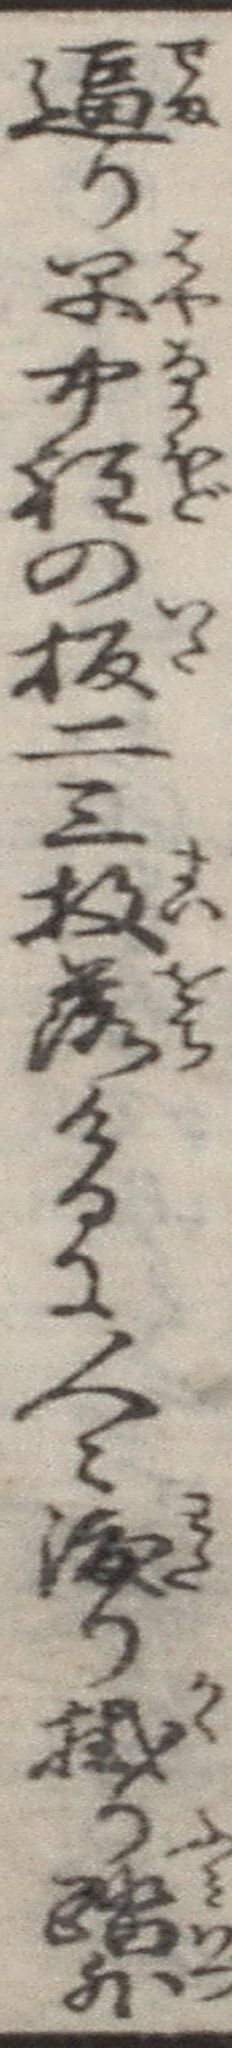逼り早中程の板二三枚落けるに人々渡り掛り踏外
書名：諸國大地震年代記　末代噺種
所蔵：東京大学地震研究所図書室 Earthquake Research Institute Library, The University of Tokyo, JAPAN
